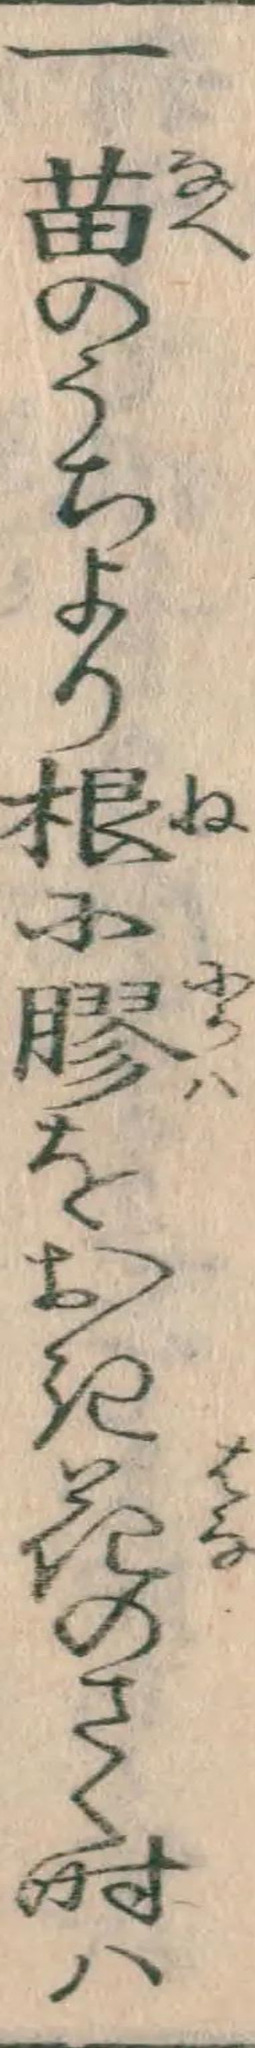一苗のうちより根に膠をおき花のさく時は
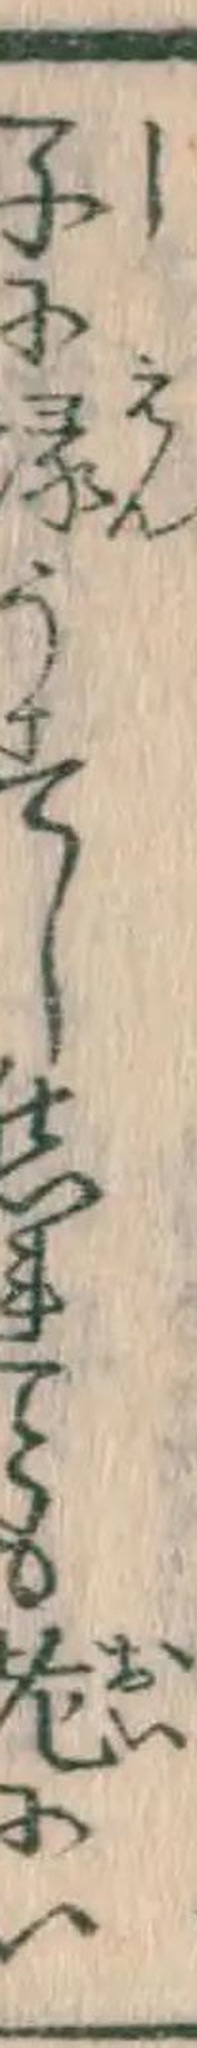子に縁うすし然れとも老にい
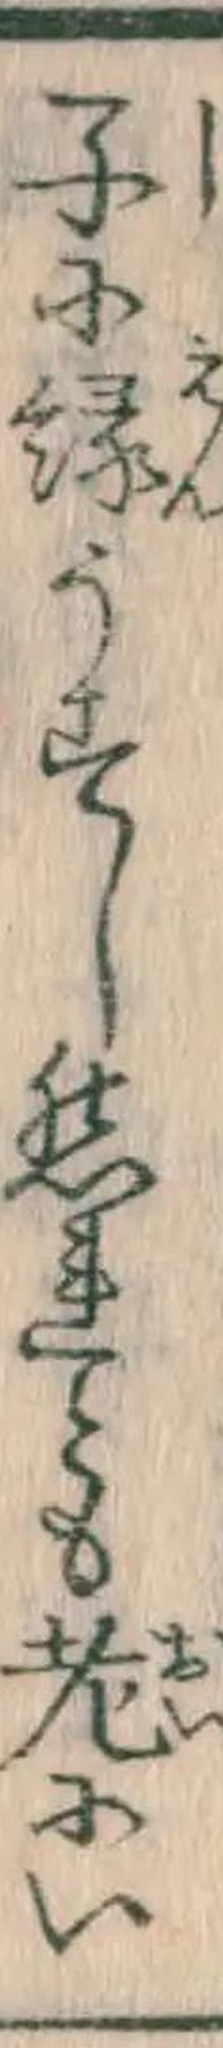子に縁うすし然れとも老にい
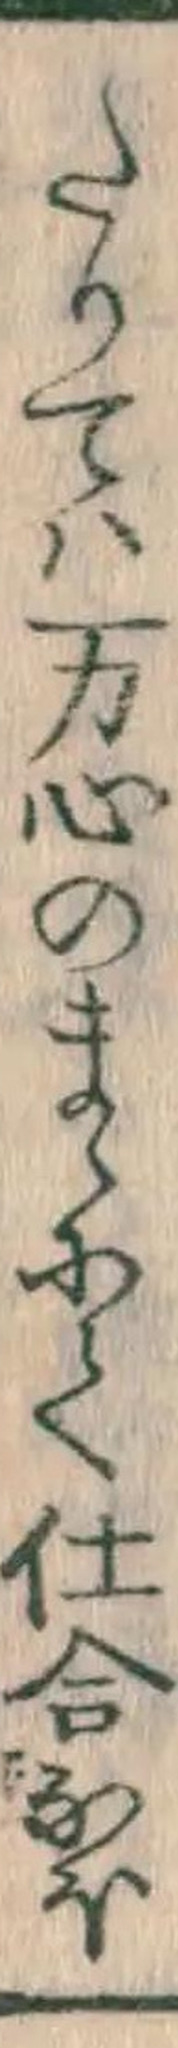たりては万心のまゝにて仕合なほ
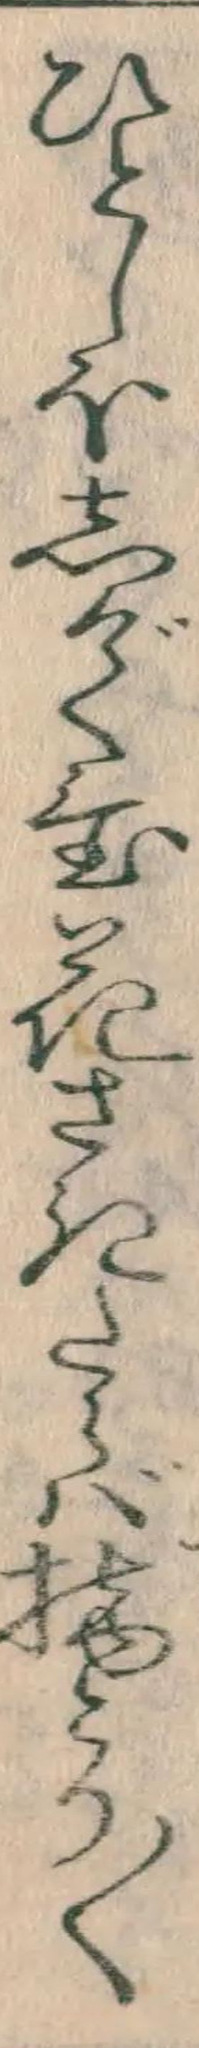ひとしほしげく置花さきたらば摘とり〳〵
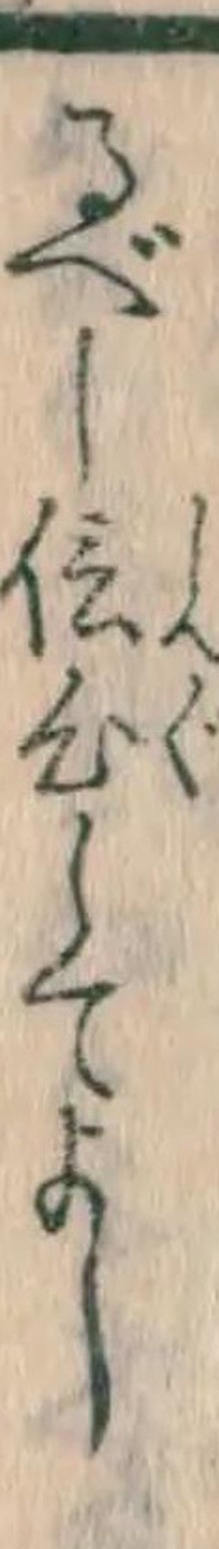るべし信心してよし
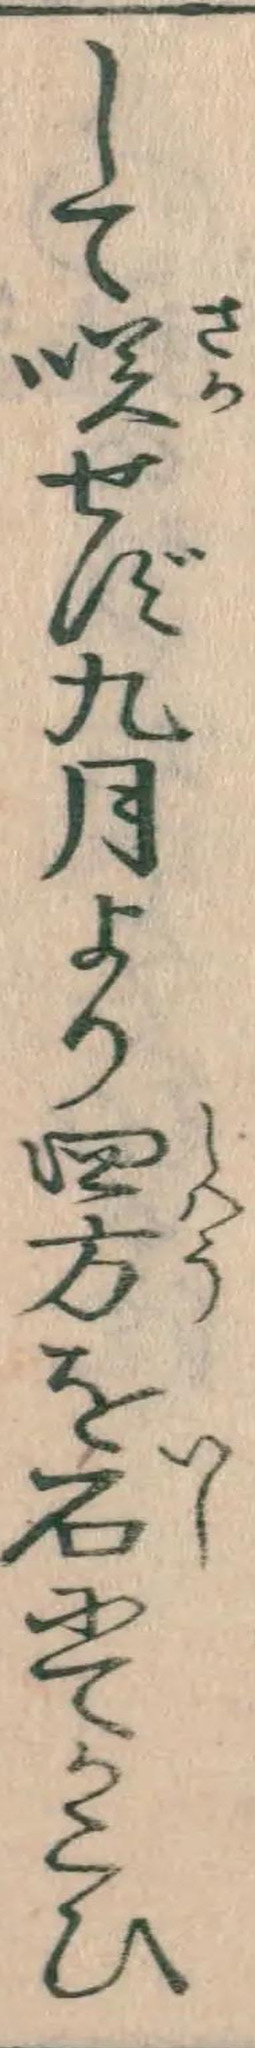して咲せず九月より四方を石にてかこひ
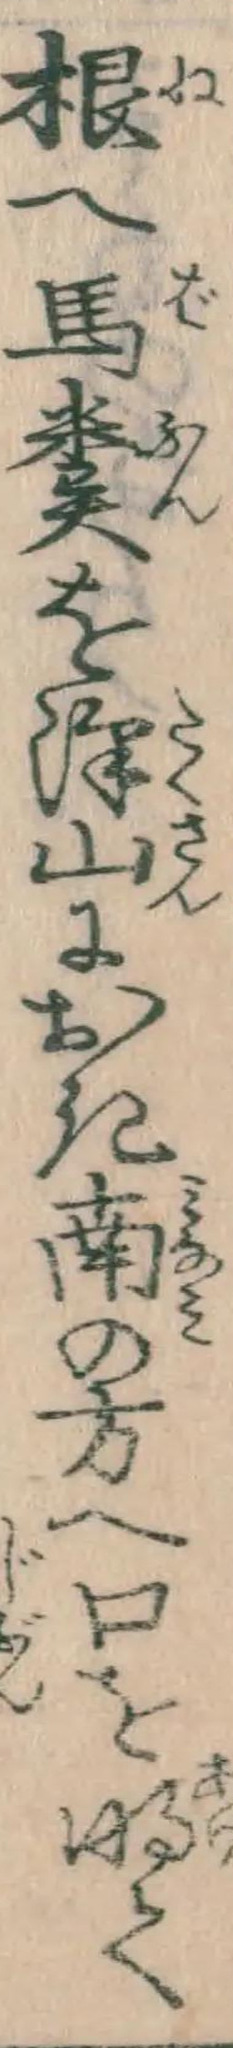根へ馬糞を沢山におき南の方へ口を明て
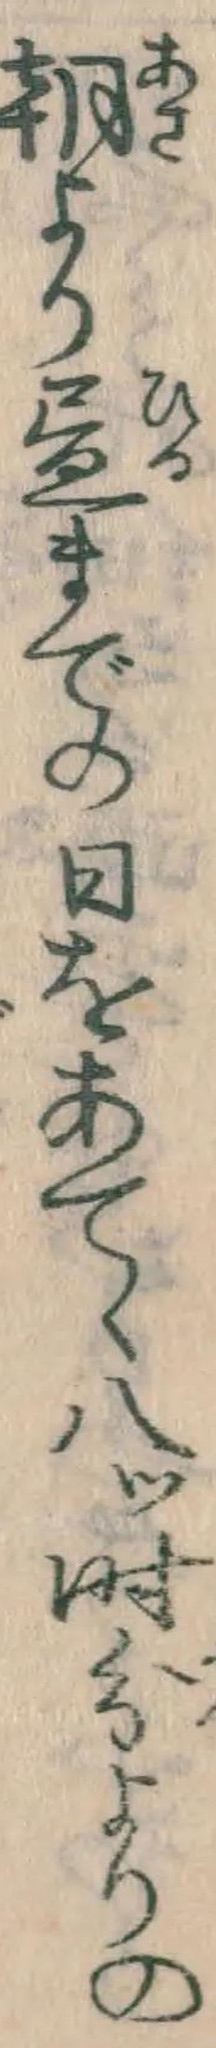朝より昼までの日をあてゝ八ッ時分よりの
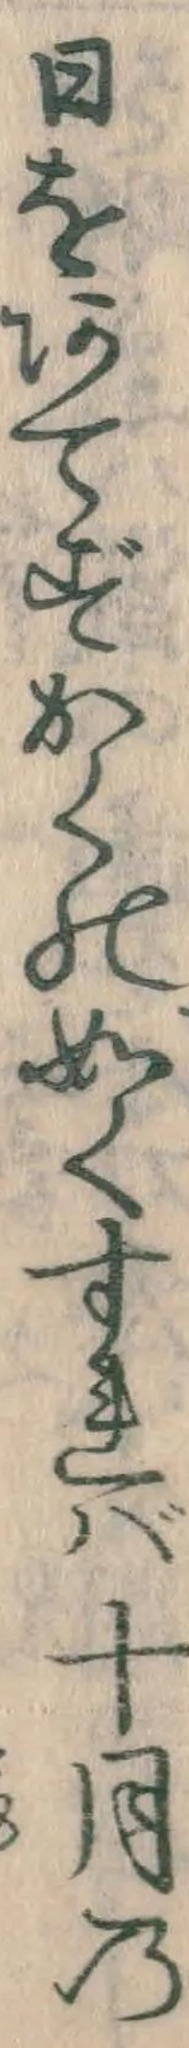日をあてずかくの如くすれば十月の
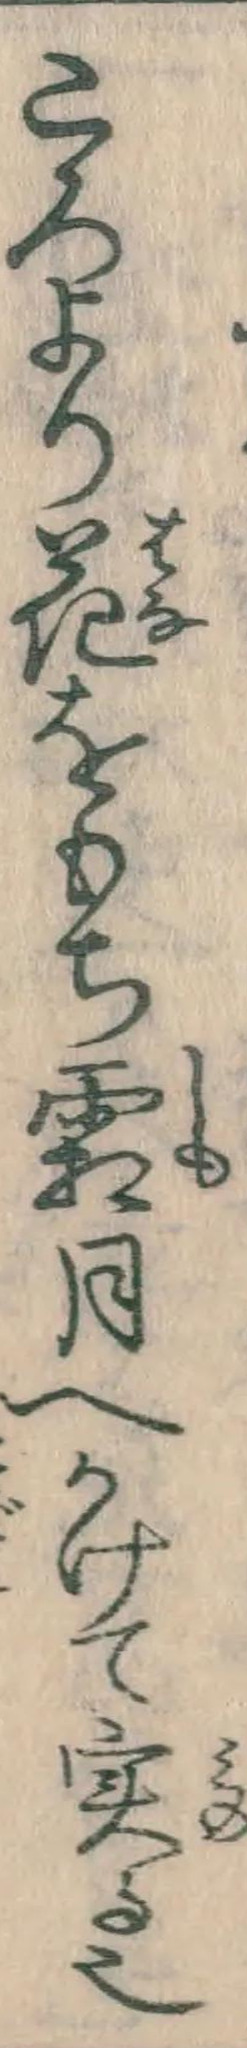ころより花をもち霜月へかけて実る也
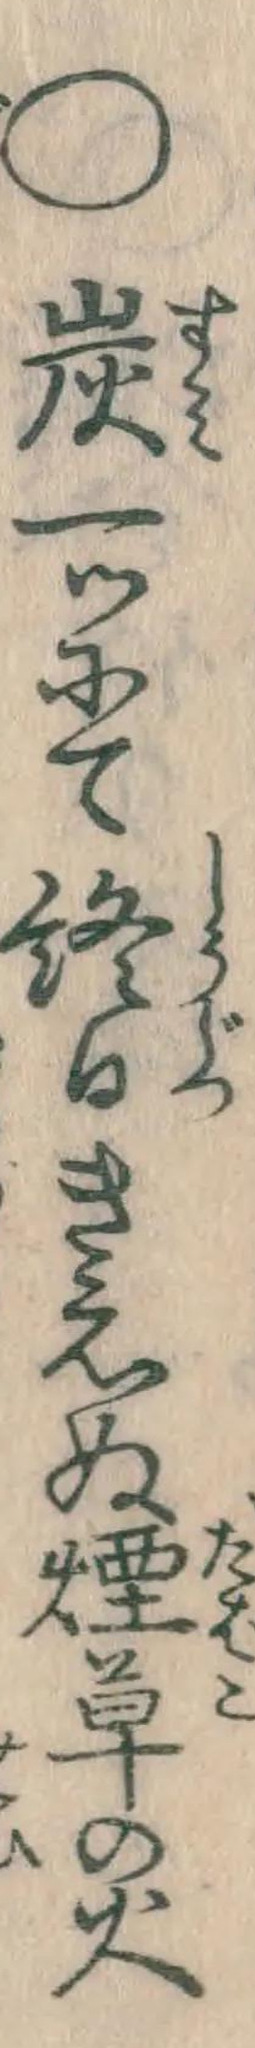○炭一ッにて終日きえぬ煙草の火
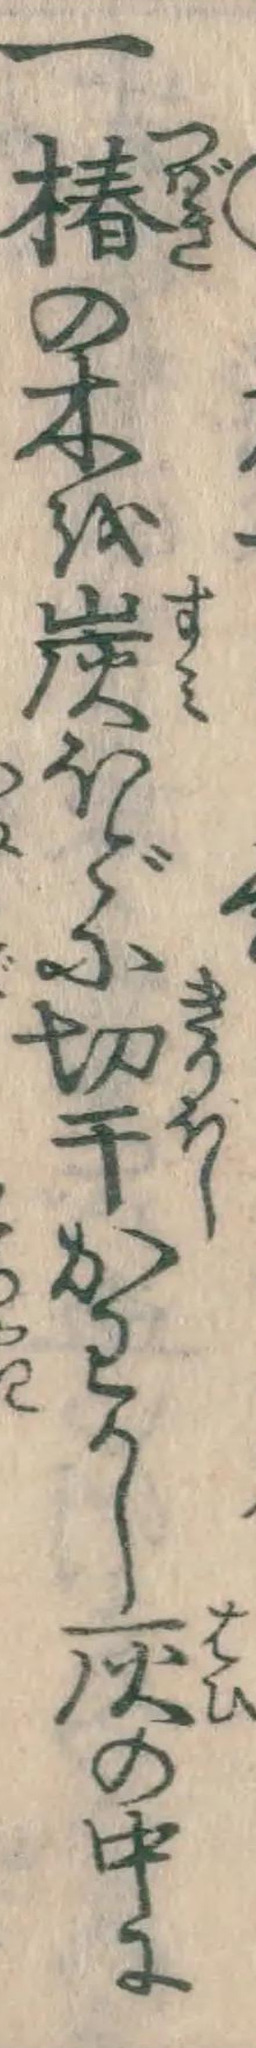一椿の木を炭ほどに切干かわかし灰の中に
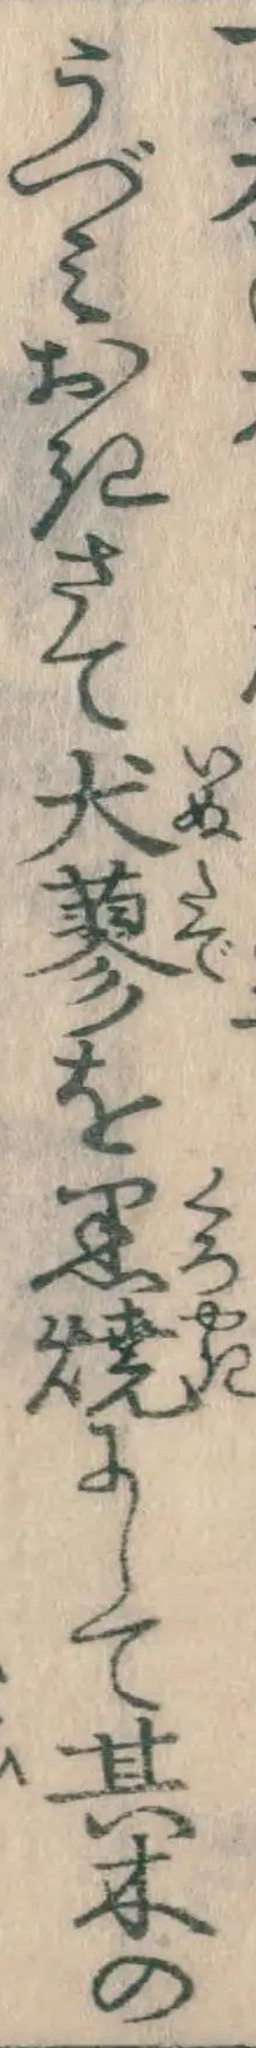うづみおきさて犬蓼を黒焼にして其木の
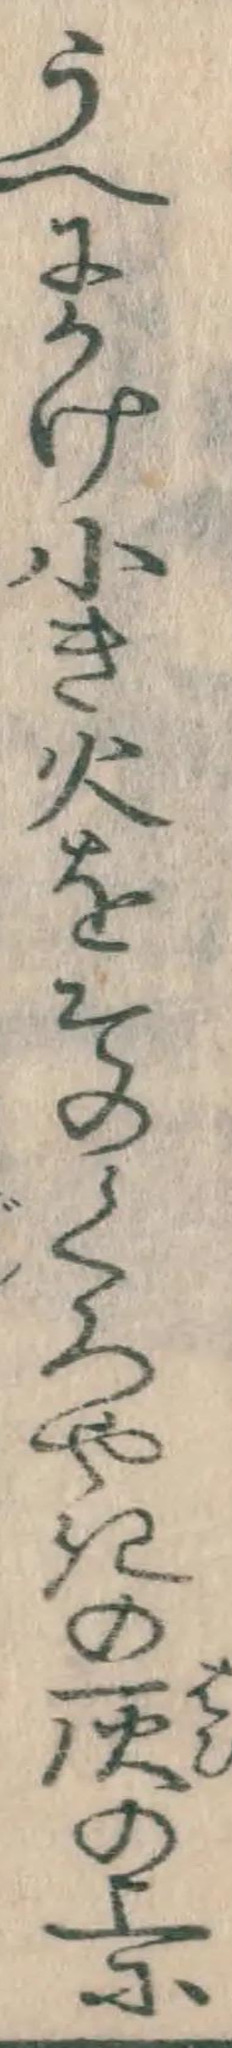うへにかけ小き火をそのくろやきの灰の上に
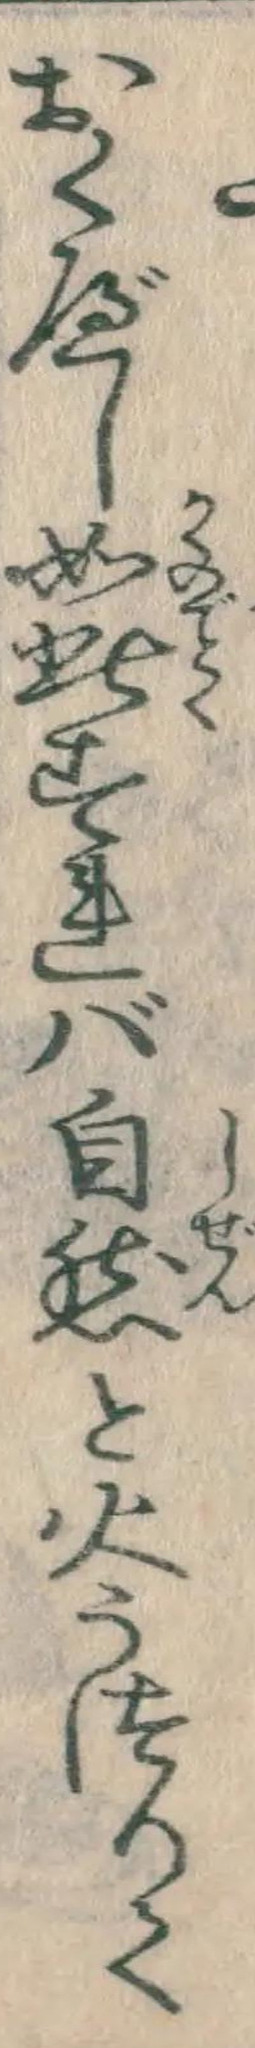おくべし如此すれば自然と火うつりて
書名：広益秘事大全 3巻. [2]
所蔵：国立国会図書館 National Diet Library, JAPAN
